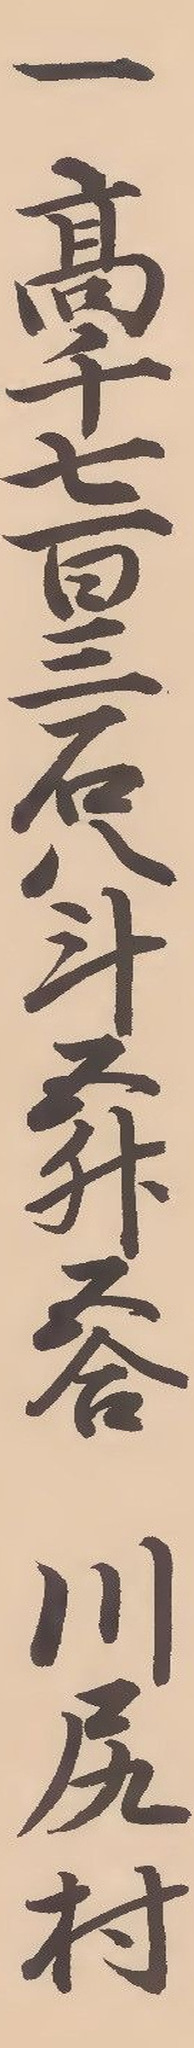一高千七百三石八斗五升五合川尻村
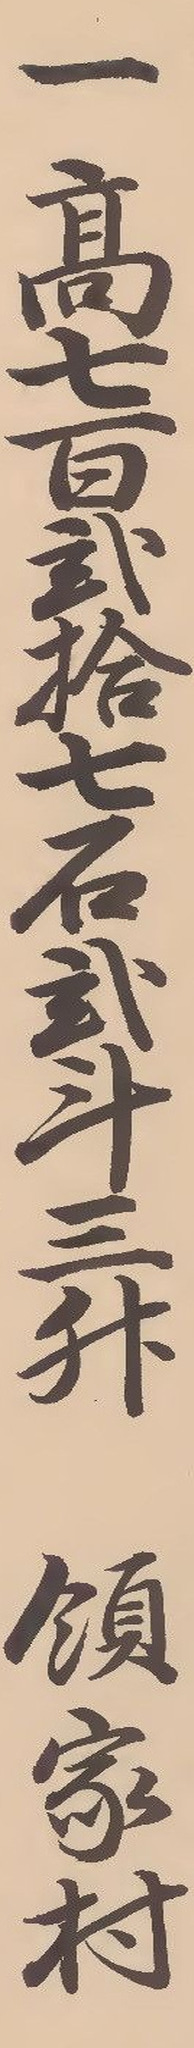一高七百弐拾七石弐斗三升領家村
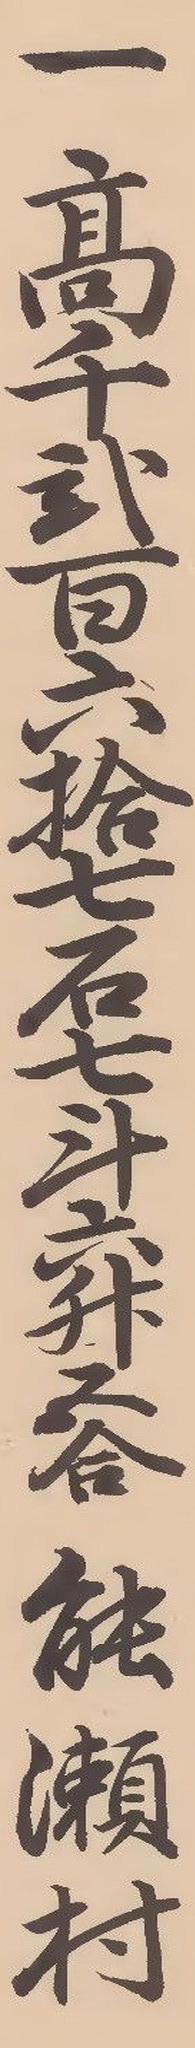一高千弐百六拾七石七斗六升五合能瀬村
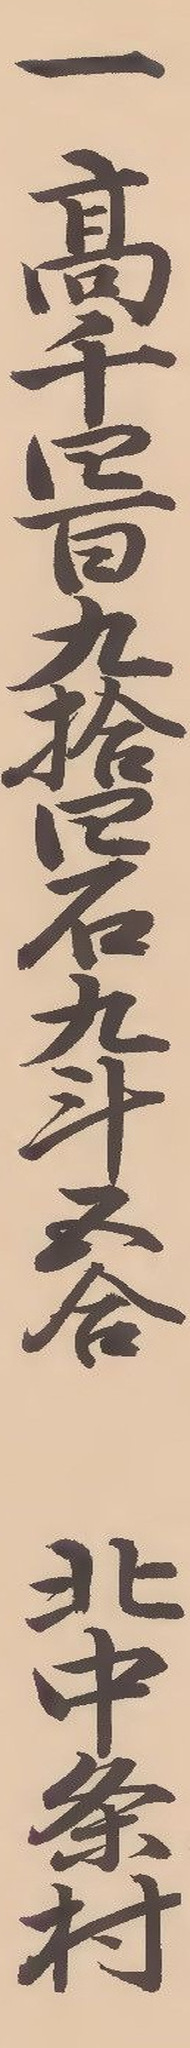一高千四百九拾四石九斗五合北中条村

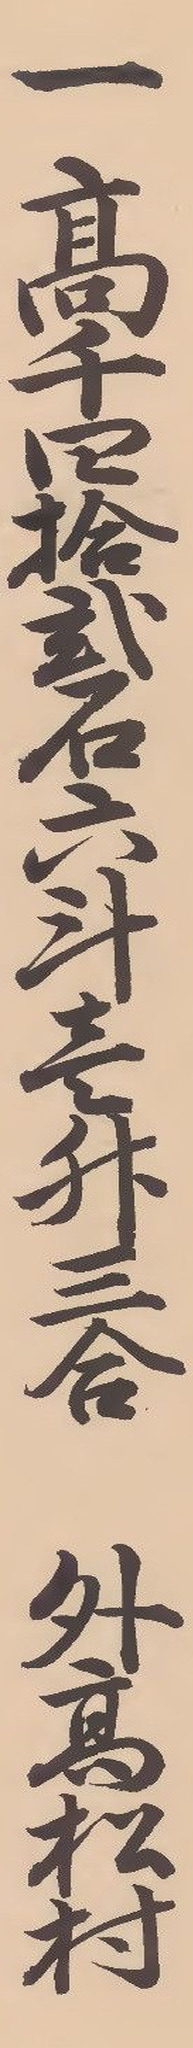一高千四拾弐石六斗壱升三合外高松村
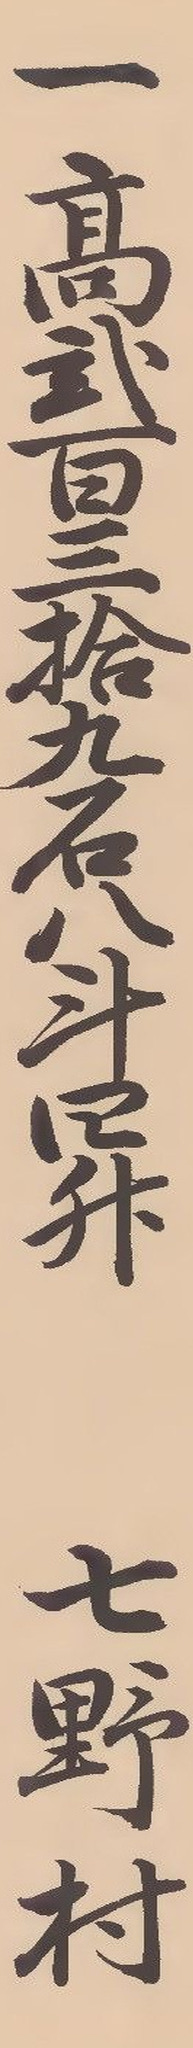一高弐百三拾九石八斗四升七野村
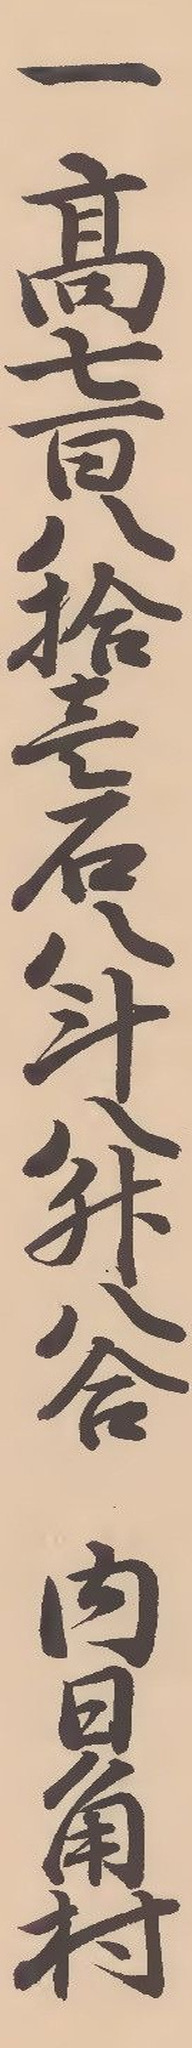一高七百八拾壱石八斗八升八合内日角村
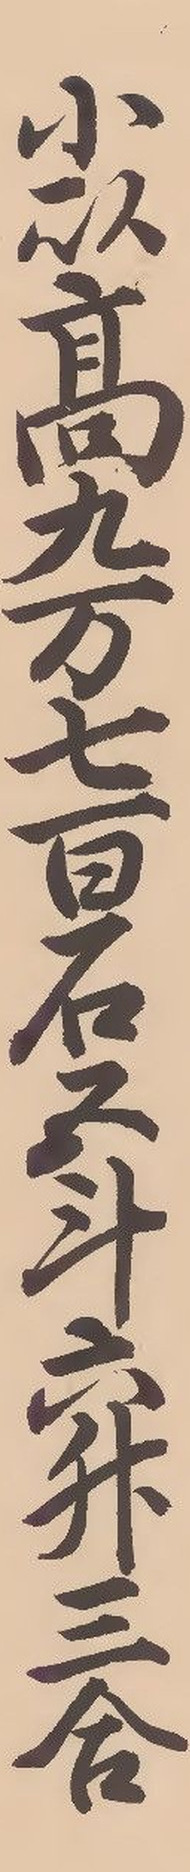小以高九万七百石五斗六升三合

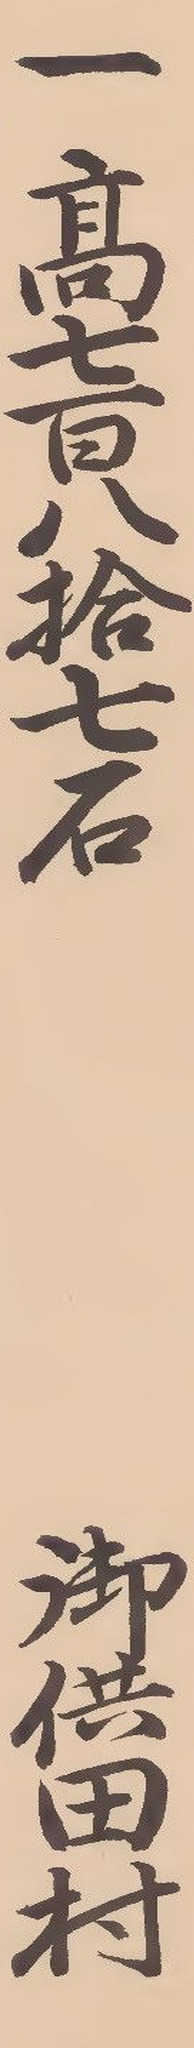一高七百八拾七石御供田村
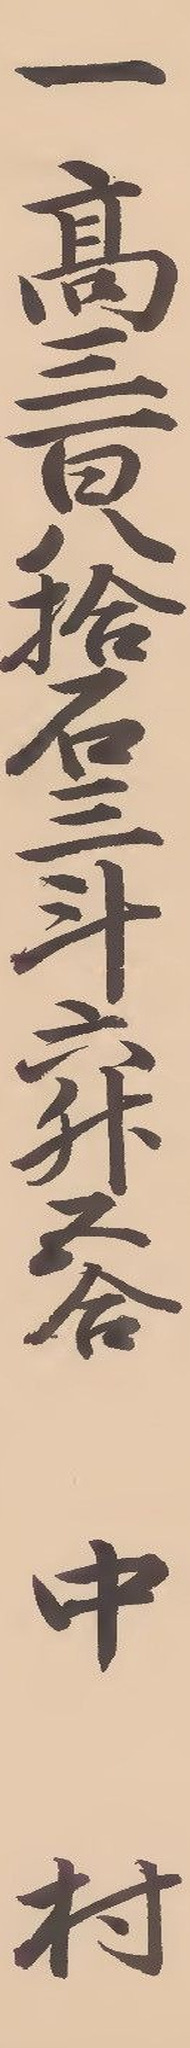一高三百八拾石三斗六升五合中村

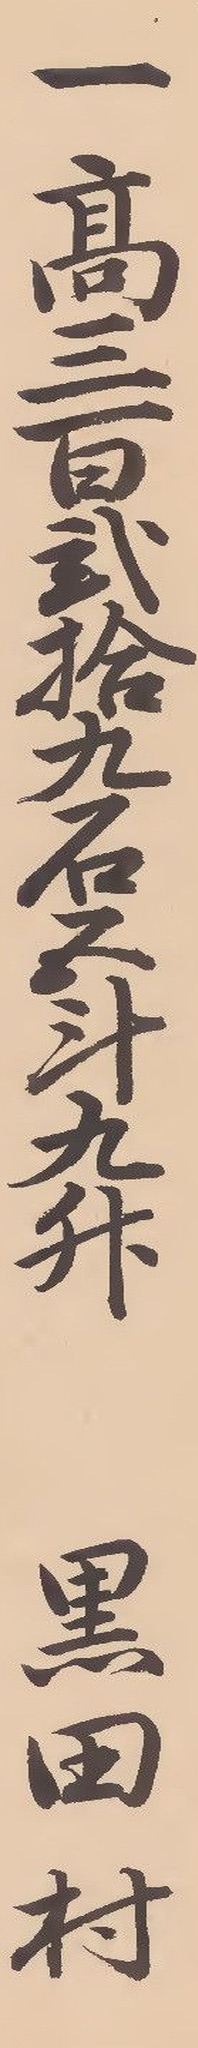一高三百弐拾九石五斗九升黒田村
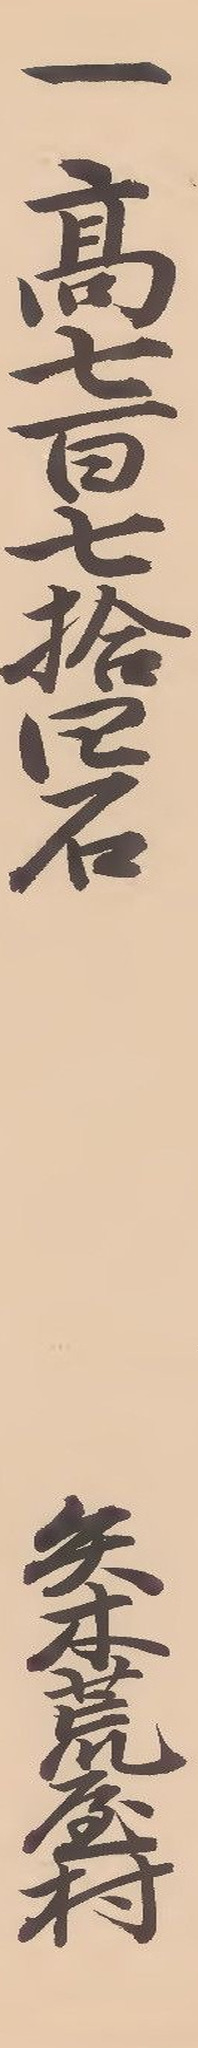一高七百七拾四石矢木荒屋村
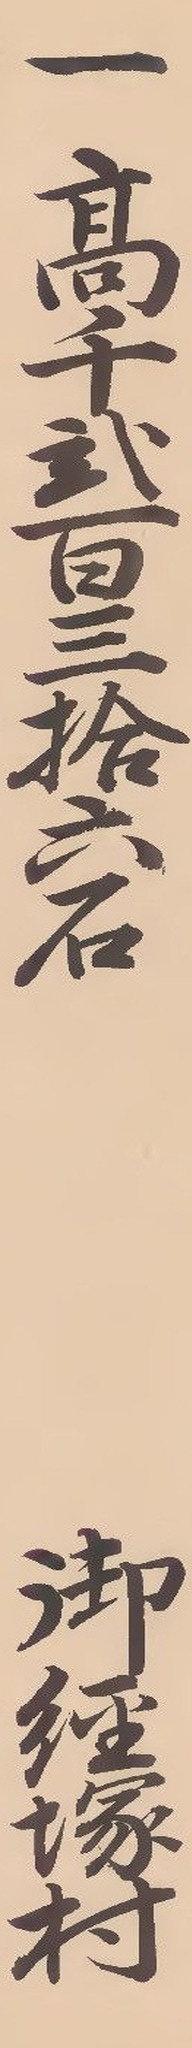一高千弐百三拾六石御経塚村
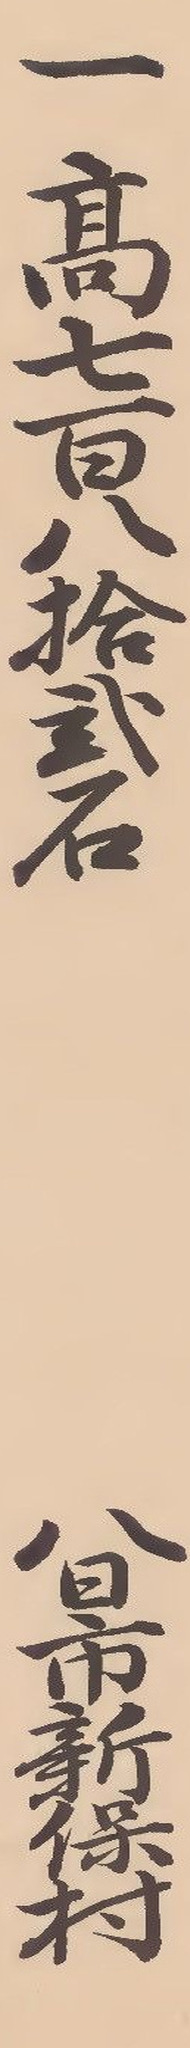一高七百八拾弐石八日市新保村
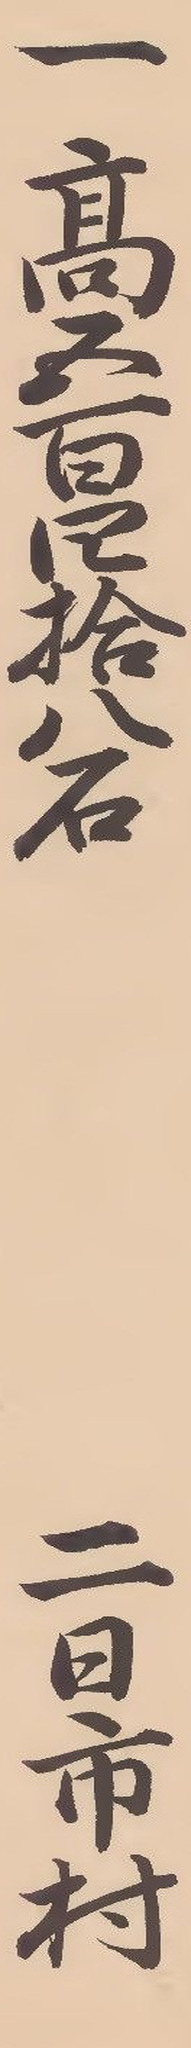一高五百四拾八石二日市村

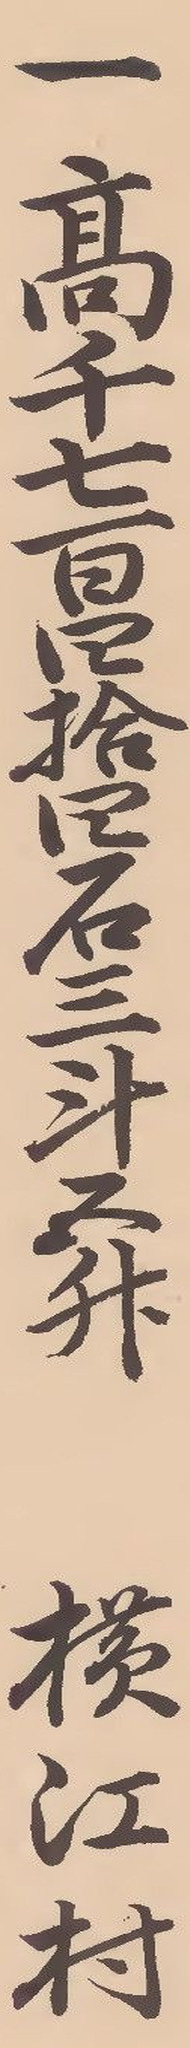一高千七百四拾四石三斗五升横江村
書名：加賀国郷帳
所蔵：国立公文書館 National Archives of Japan
